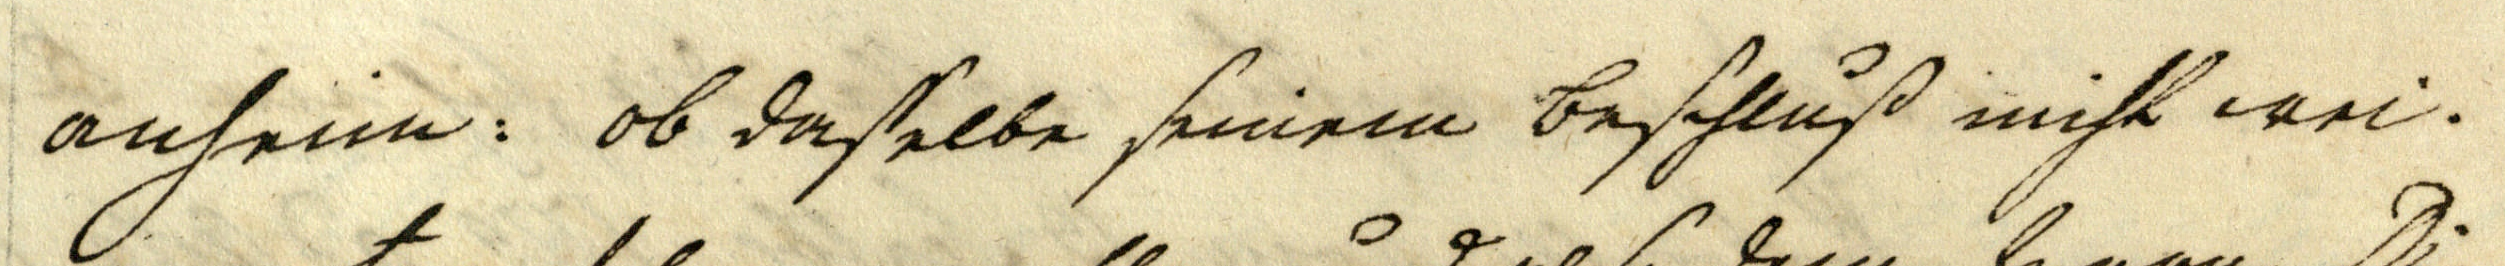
anheim: ob dasselbe seinem Beschluß nicht wei-
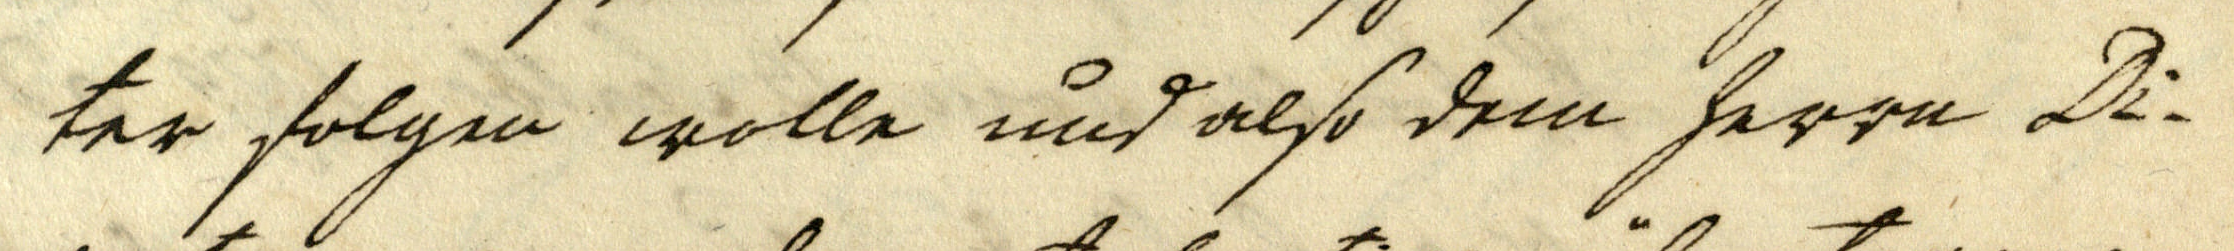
ter folgen wolle und also dem herrn Di-
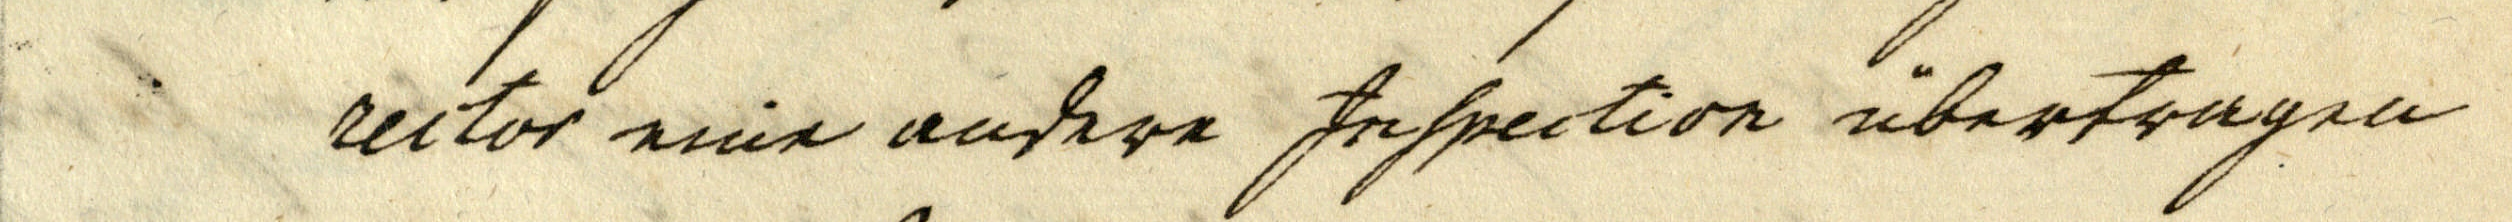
rector eine andere Inspection übertragen
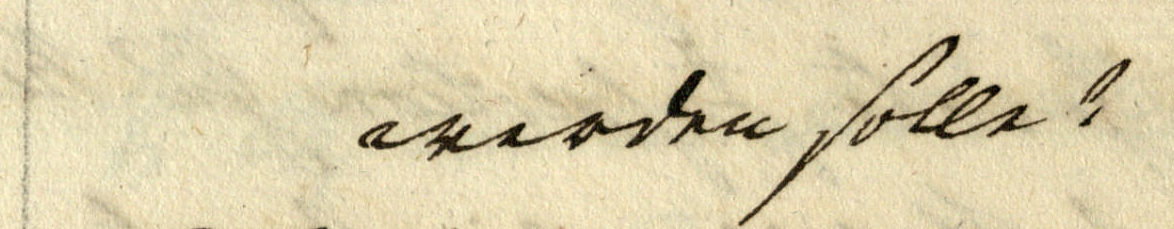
werden solle?
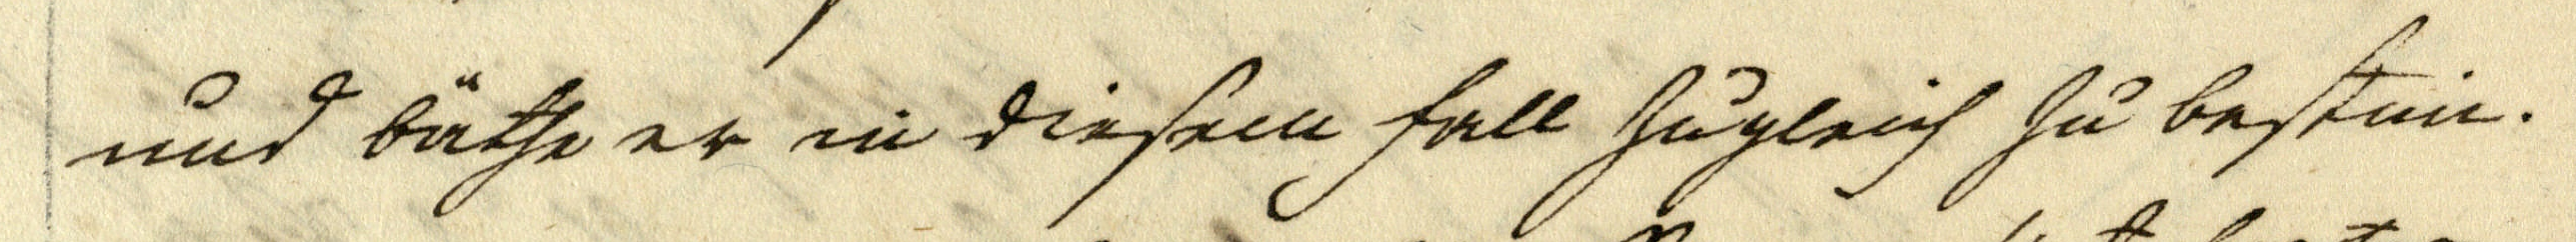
und bäthe er in diesem Fall zugleich zu bestim-
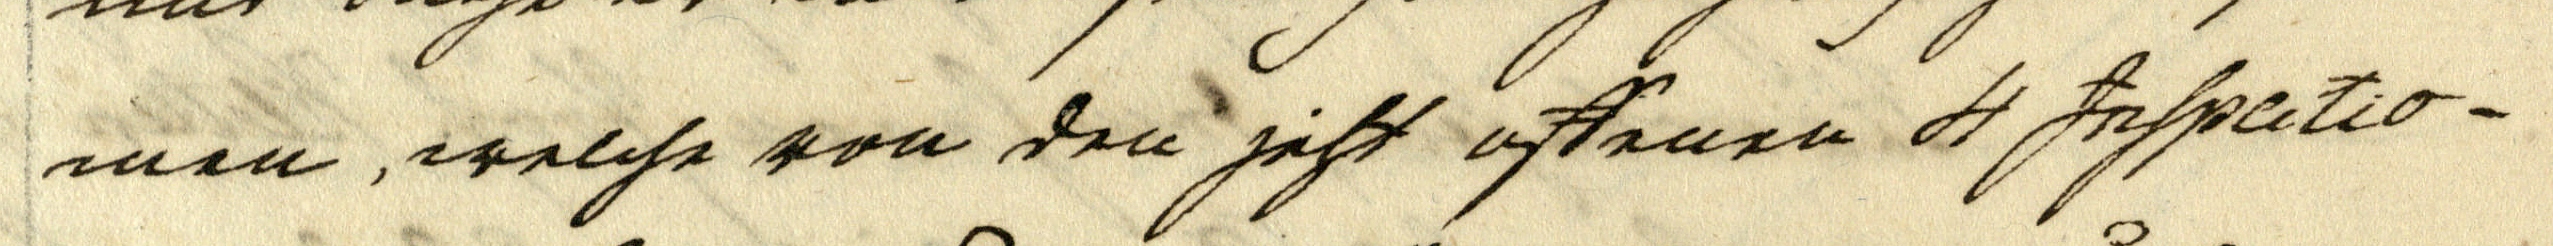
men, welche von den jetzt offenen 4 Inspectio-
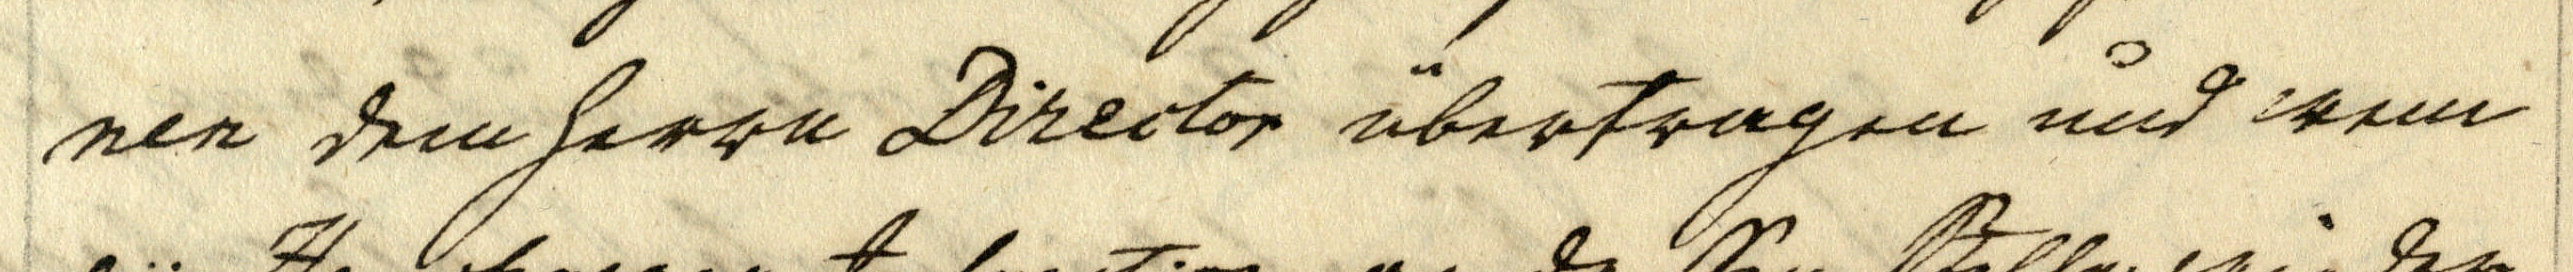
nen dem herrn Director übertragen und wem
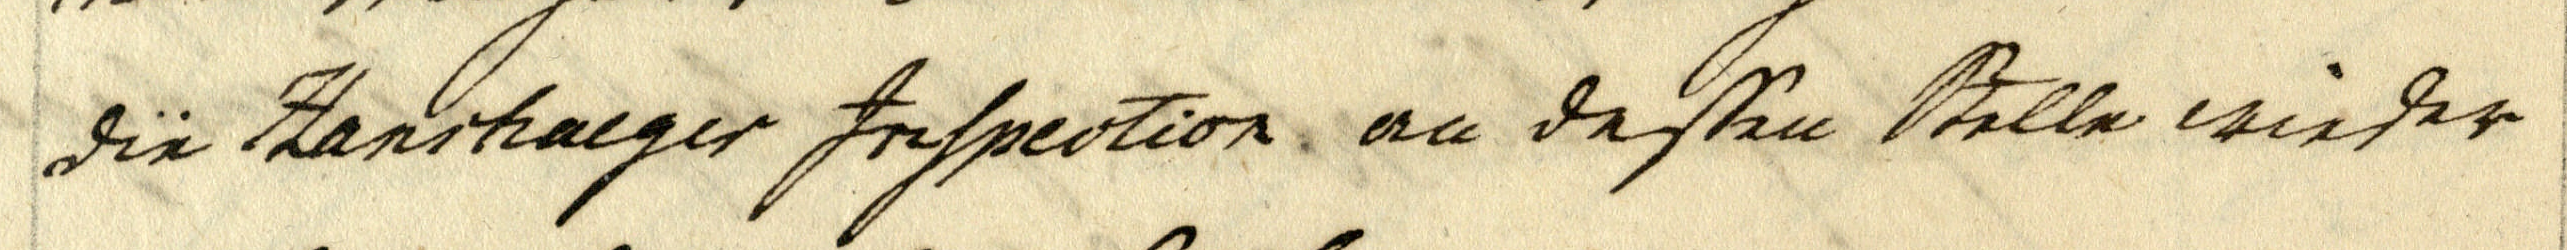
die Hanshaeger Inspection an dessen Stelle wieder
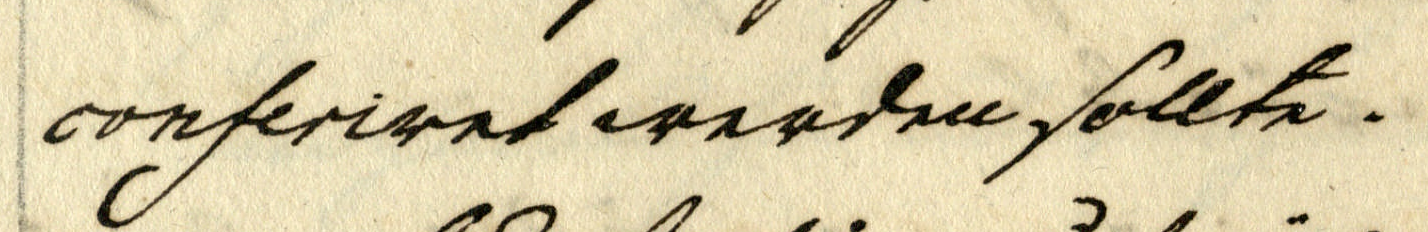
conferiret werden sollte.
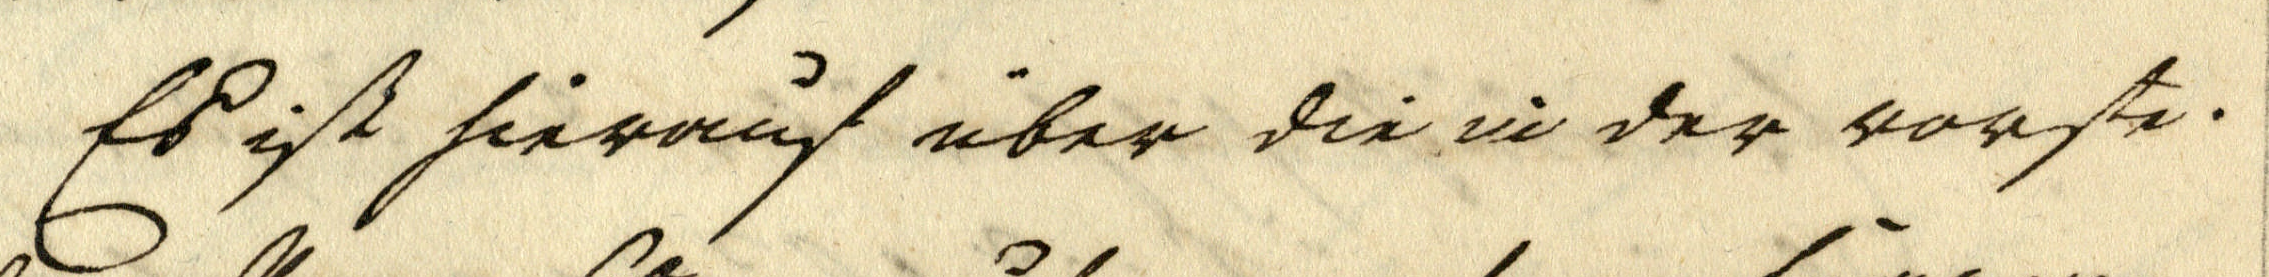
Es ist hierauf über die in der vorste-
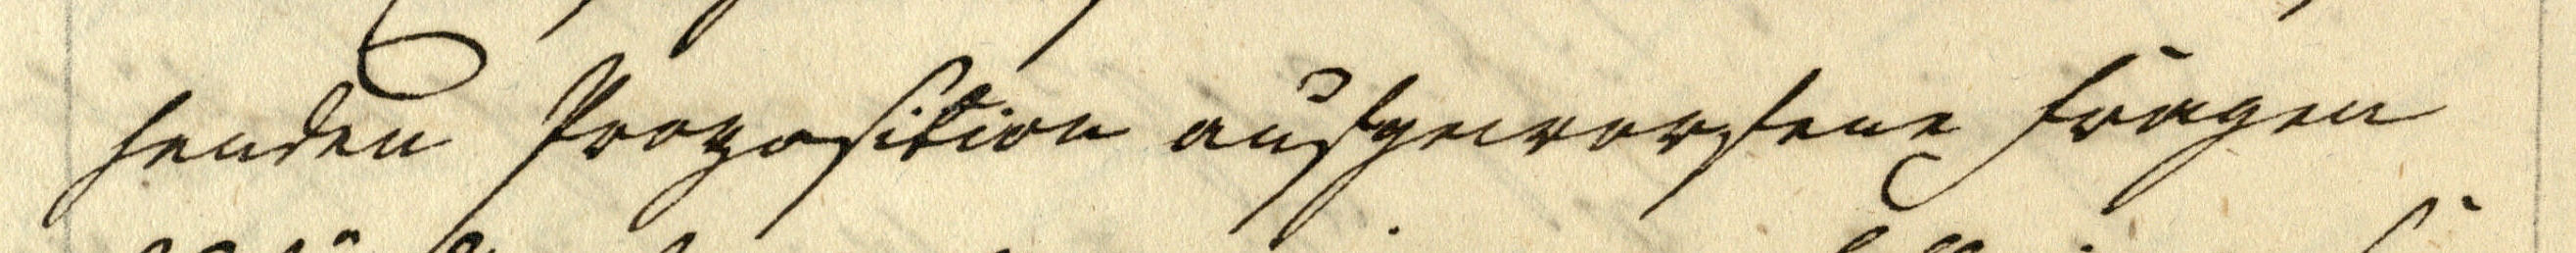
henden proposition aufgeworfene Fragen
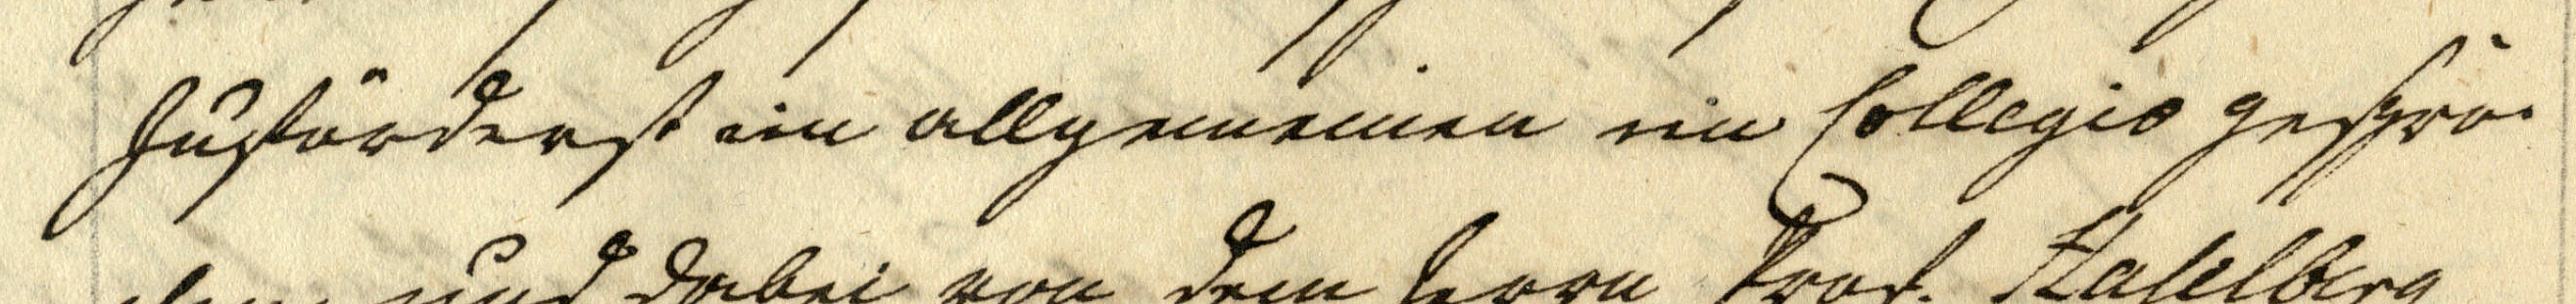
zuförderst im allgemeinen im Collegio gespro-
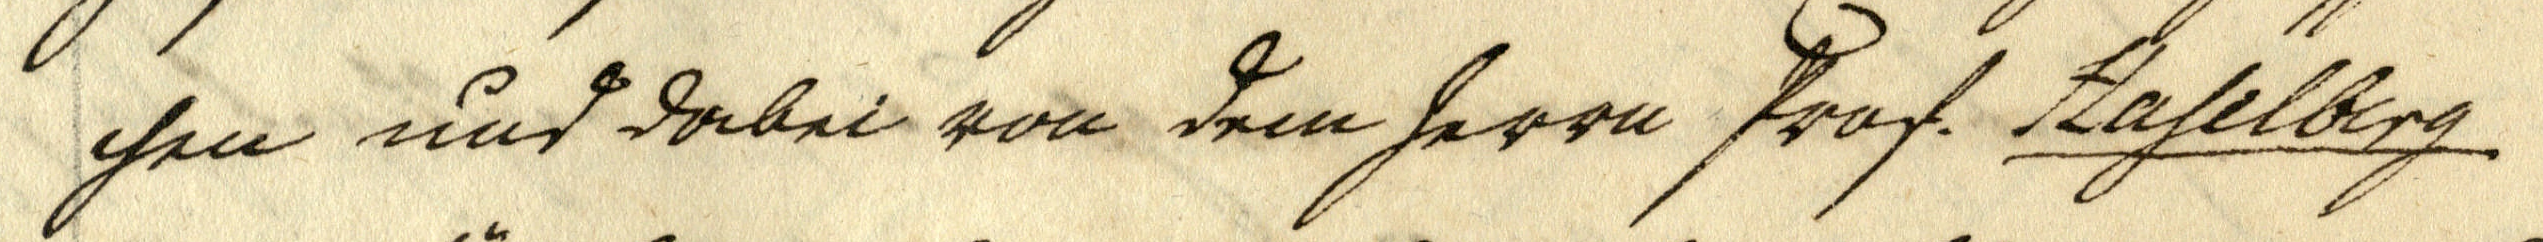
chen und dabei von dem herrn Prof. Haselberg
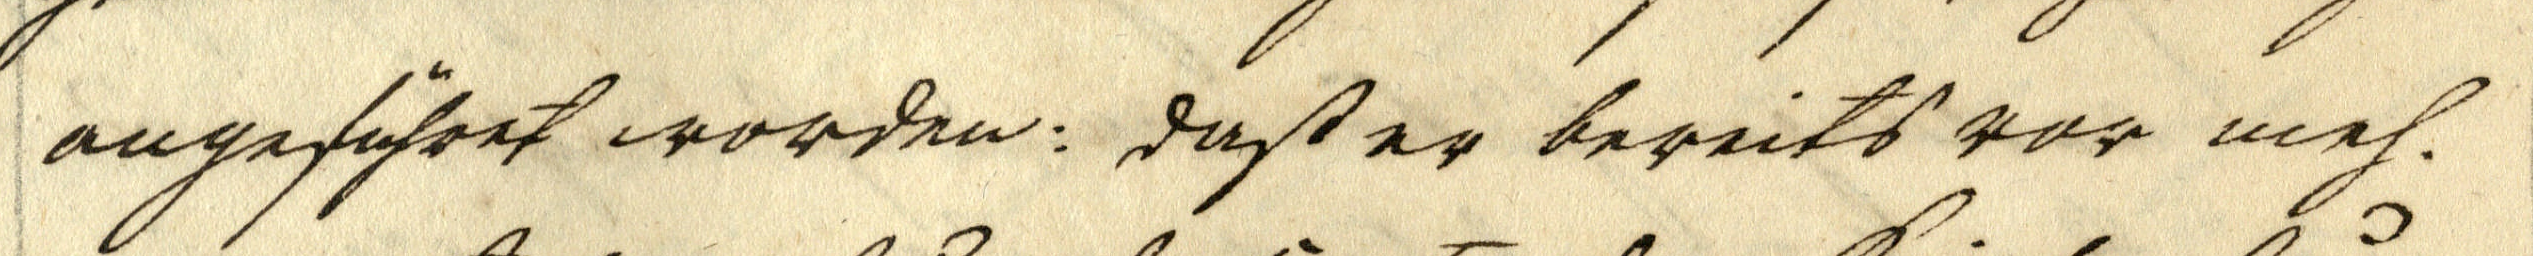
ausgeführet worden: daß er bereits vor meh-
